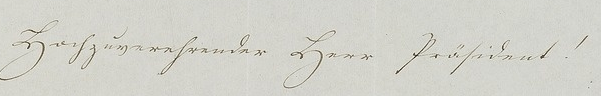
Hochzuverehrender Herr Präsident!
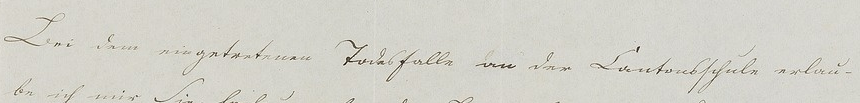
Bei dem eingetretenen Todesfalle an der Cantonsschule erlau-
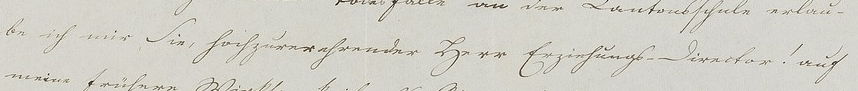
be ich mir, Sie, hochzuverehrender Herr Erziehungs-Director! auf
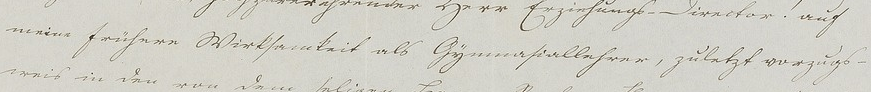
meine frühere Wirksamkeit als Gymnasiallehrer, zuletzt vorzugs-
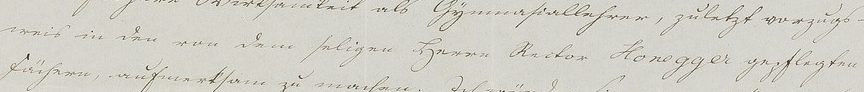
weis in den von dem seligen Herrn Rector Honegger gepflegten
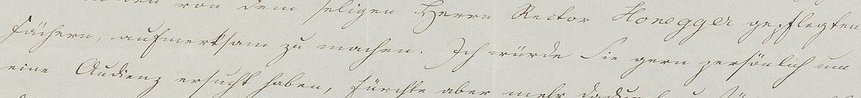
Fächern, aufmerksam zu machen. Ich würde Sie gern persönlich um
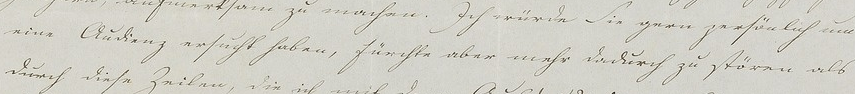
eine Audienz ersucht haben, fürchte aber mehr dadurch zu stören als
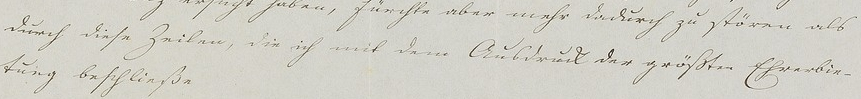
durch diese Zeilen, die ich mit dem Ausdruck der größten Ehrerbie-
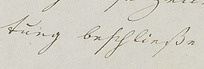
tung beschließe
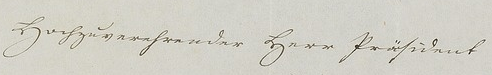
Hochzuverehrender Herr Präsident
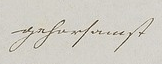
gehorsamst
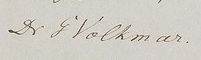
Dr G Volkmar.
